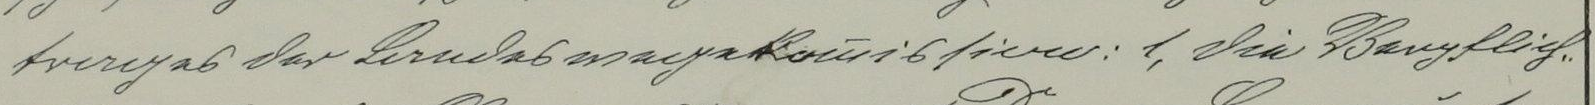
trages der Landeswegekommission: 1. die Verpflich-
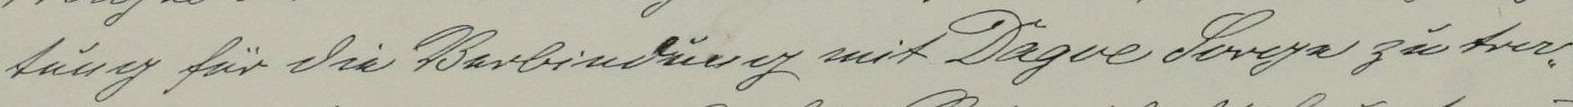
tung, für die Verbindung mit Dagoe Sorge zu tra-
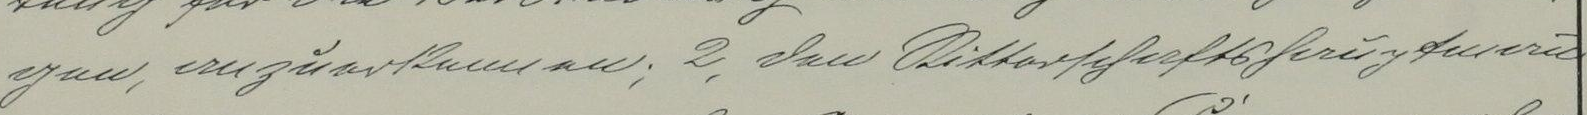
gen, anzuerkennen; 2. den Ritterschaftshauptmann
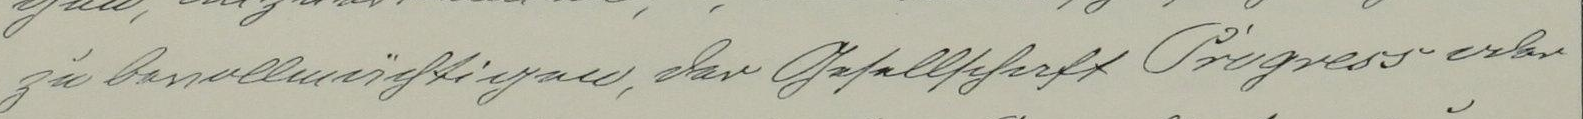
zu bevollmächtigen, der Gesellschaft Progress oder
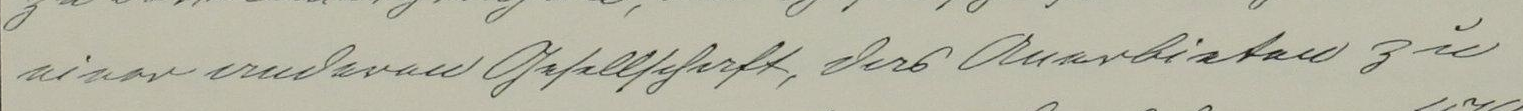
einer anderen Gesellschaft, das Anerbieten zu
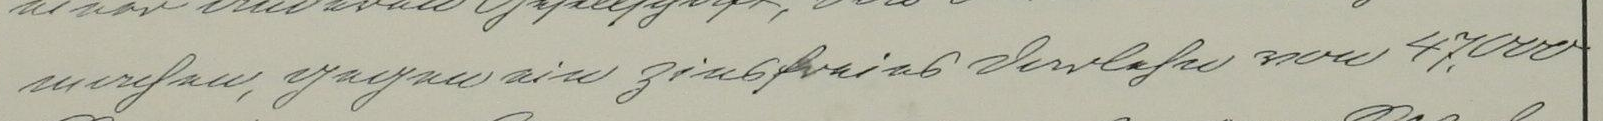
machen, gegen ein zinsfreies Darlehn von 47.000
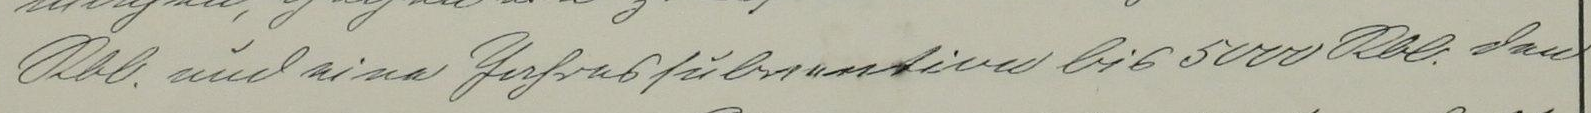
Rbl. und eine Jahressubvention bis 5000 Rbl. den
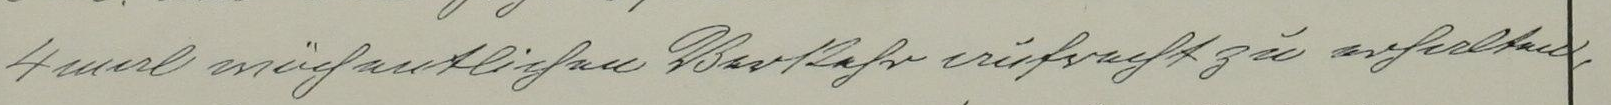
4mal wöchentlichen Verkehr aufrecht zu erhalten,
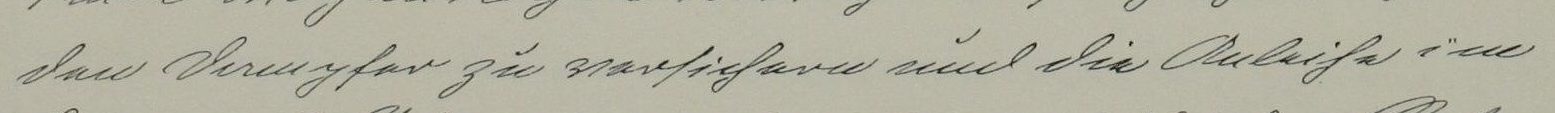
den Dampfer zu versichern und die Anleihe im
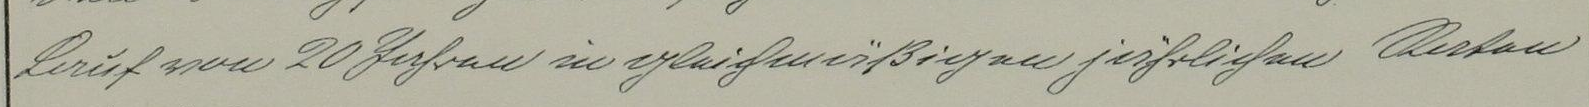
Lauf von 20 Jahren in gleichmäßigen jährlichen Raten
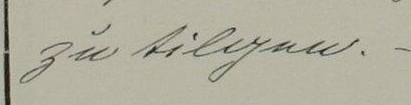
zu tilgen.
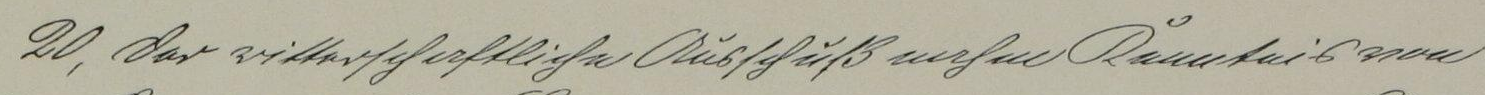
20. Der ritterschaftliche Ausschuß nahm Kenntnis von
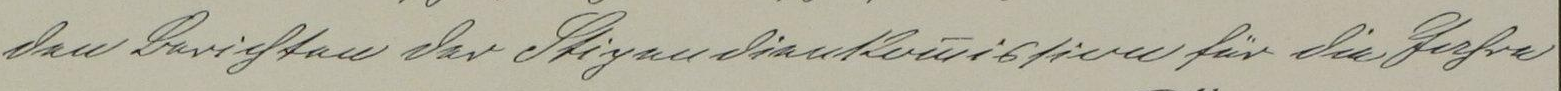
den Berichten der Stipendienkommission für die Jahre
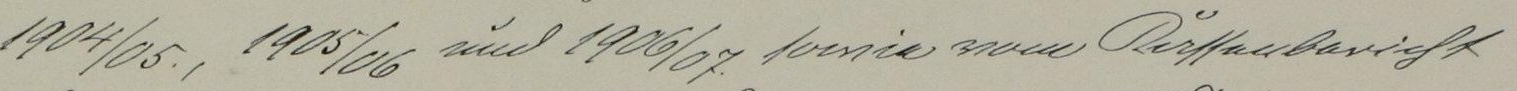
1904/05, 1905/06 und 1906/07 sowie vom Kassenbericht
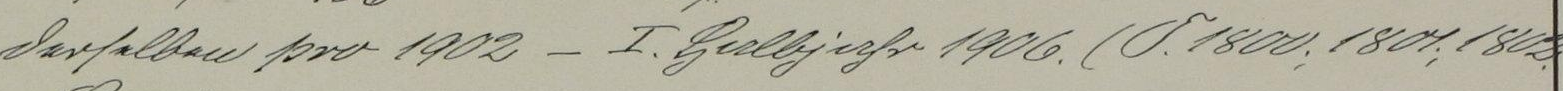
derselben pro 1902 – I. Halbjahr 1906. (T.1800; 1801; 1802.
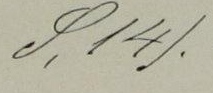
S.14).
